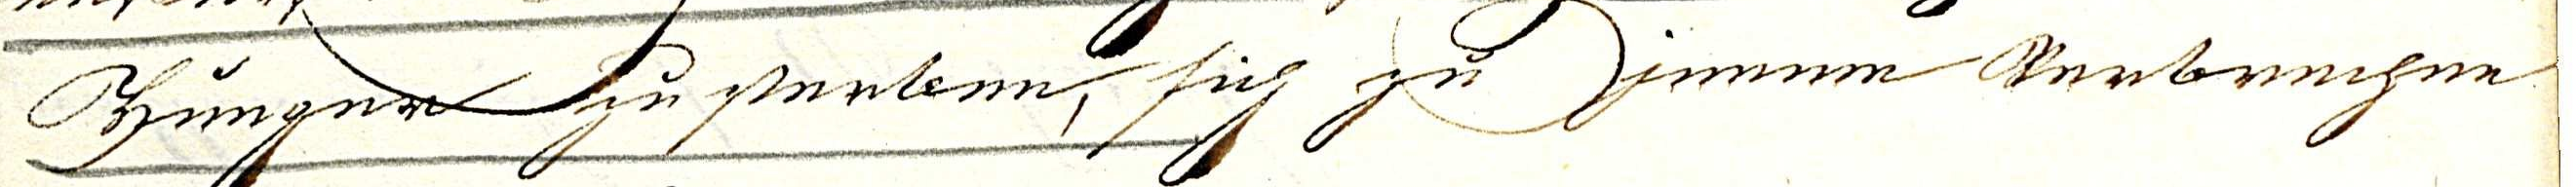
Hunger zu sterben, sich zu jenem Verbrechen
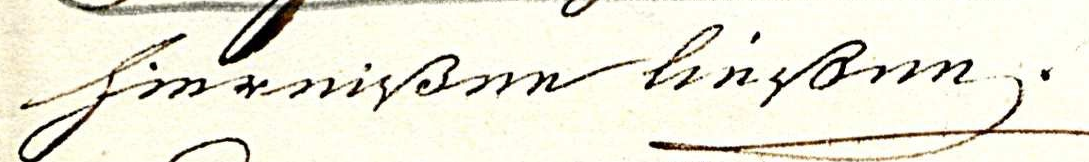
hinreißen ließen.
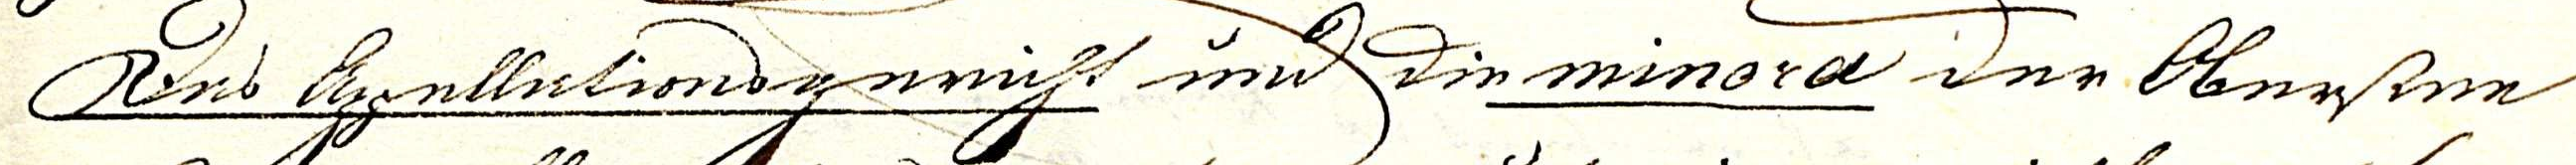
Das Appellationsgericht und die minora der Obersten
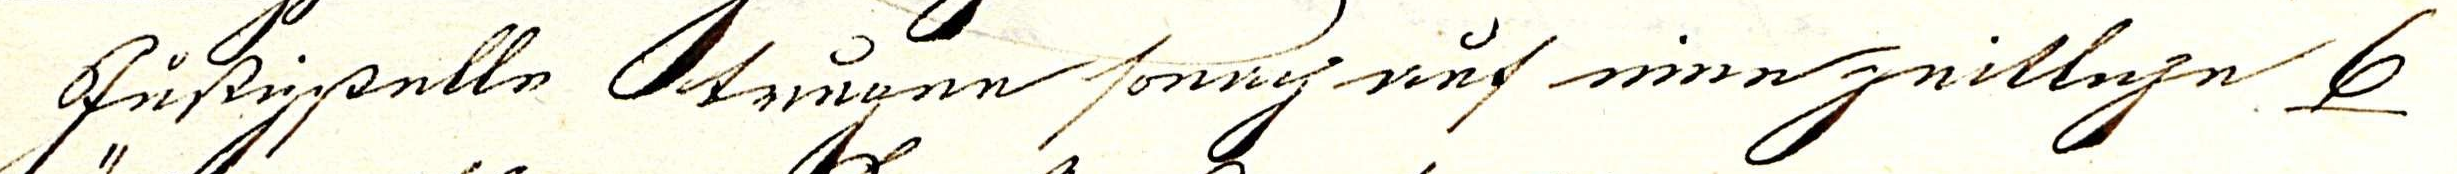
Justizstelle trugen sonach auf eine zeitliche 6
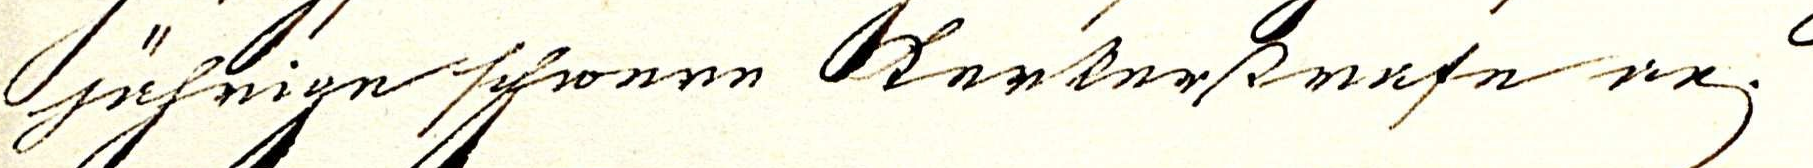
jährige schwere Kerkerstrafe an.
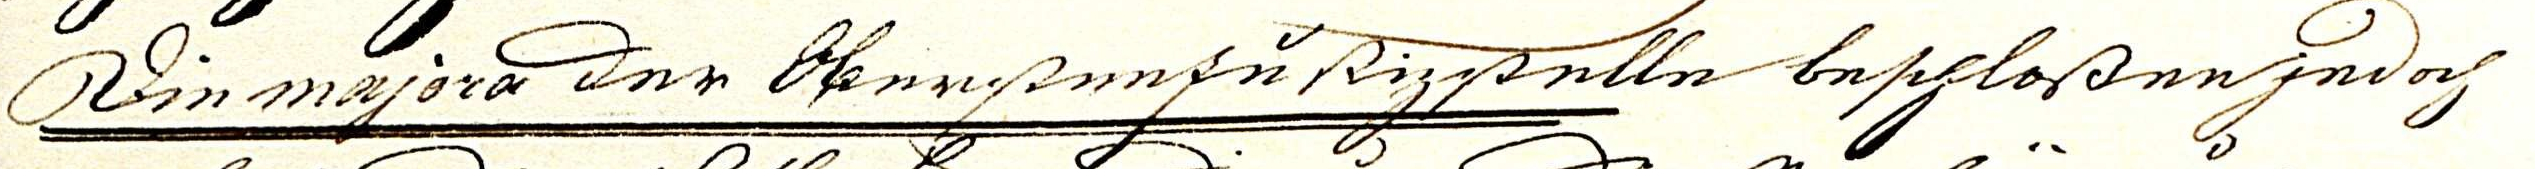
Die majora der Obersten Justizstelle beschloßen jedoch
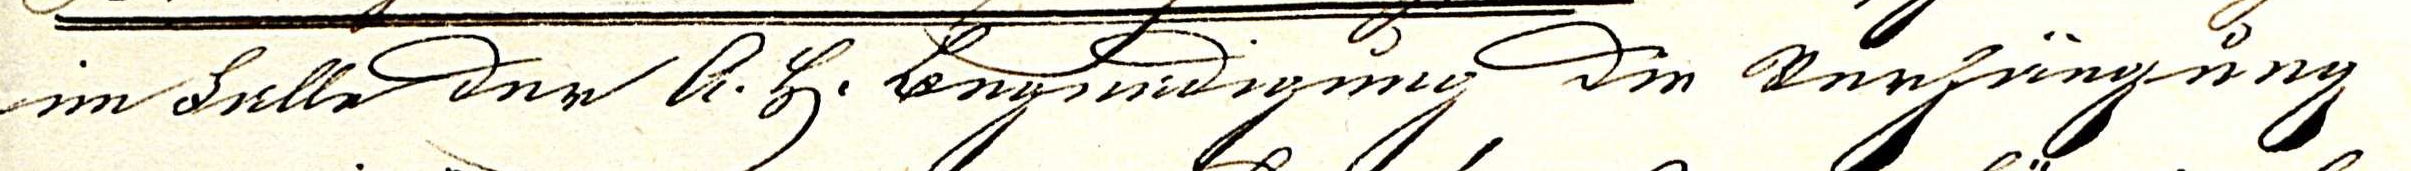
im Falle der A.H.Begnadigung die Verhängung
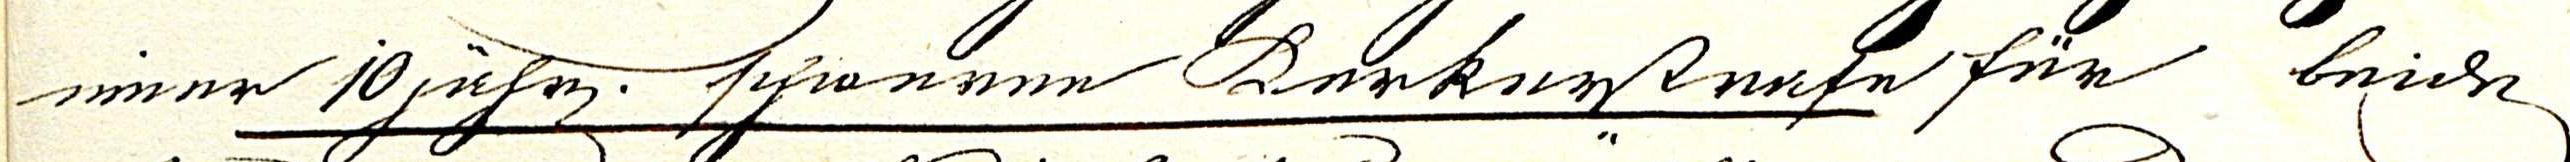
einer 10jähr. Schweren Kerkerstrafe für beide
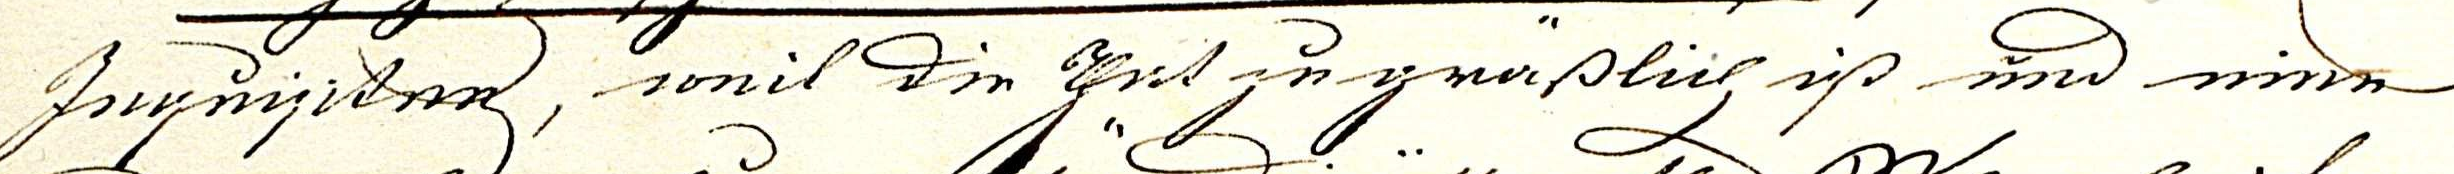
Inquisiten, weil die That zu gräßlich ist und eine
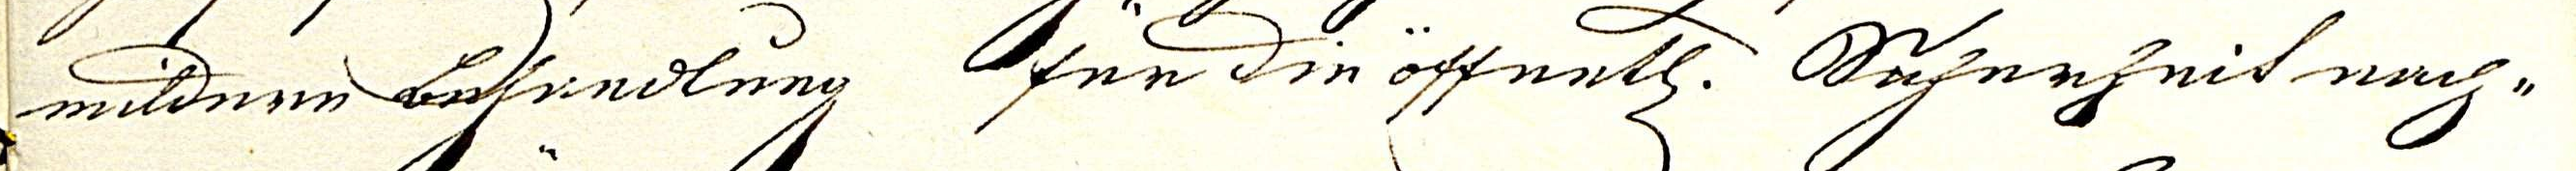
mildere Behandlung für die öffentl. Sicherheit nach¬
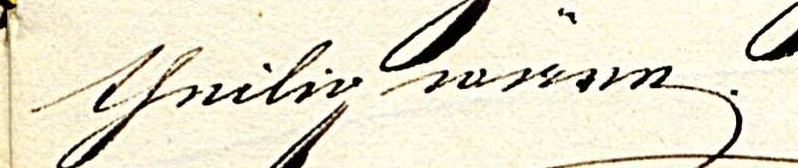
theilig wäre.
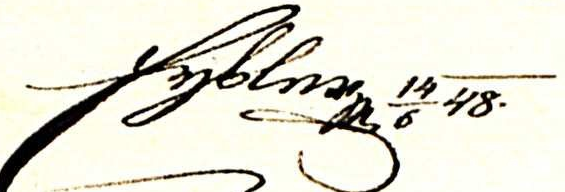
Eybler 14/6 [18]48
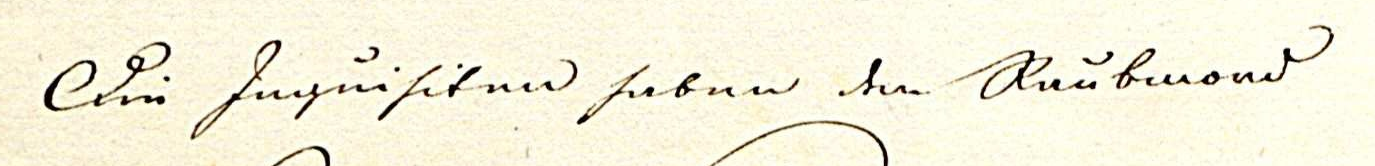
Die Inquisiten haben den Raubmord
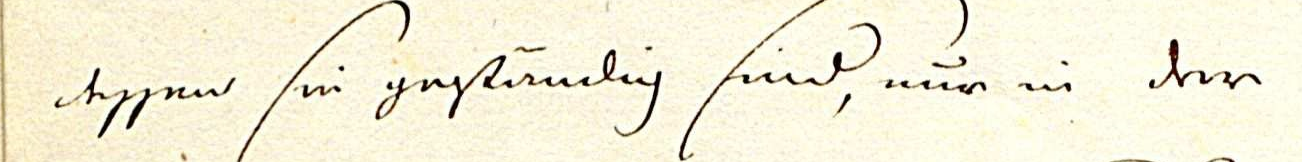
dessen sie geständig sind, nur in der
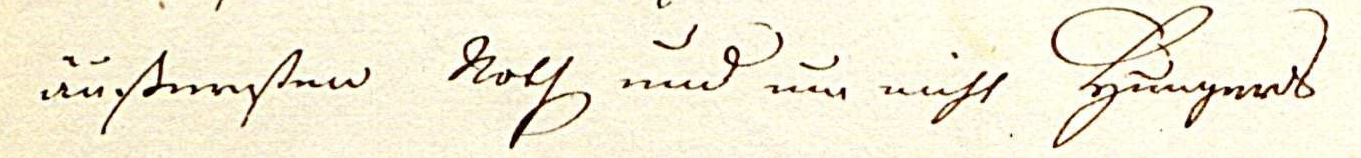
äusersten Noth und um nicht Hungers
